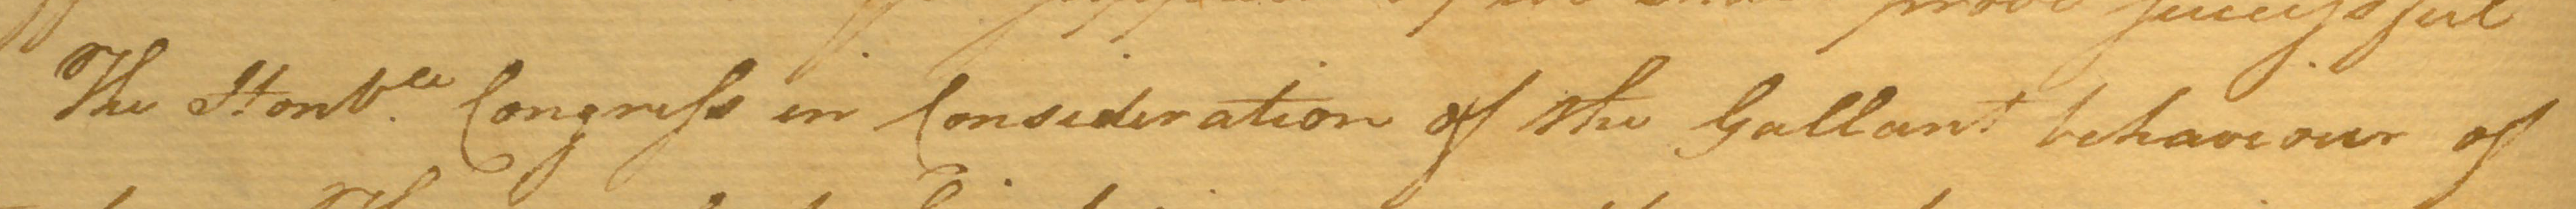The Honb^le. Congress in Consideration of the Gallant behaviour of
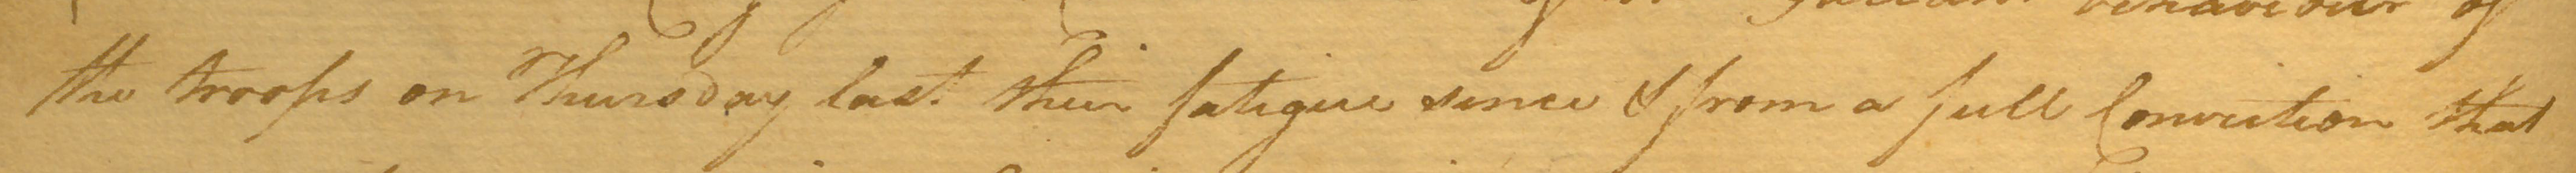the troops on Thursday last their fatigue since & from a full Conviction that
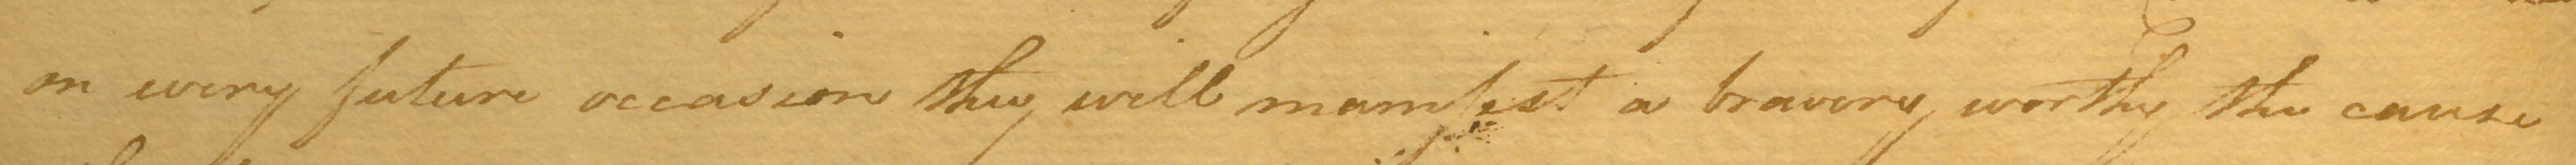on every future occasion they will manifest a bravery worthy the cause
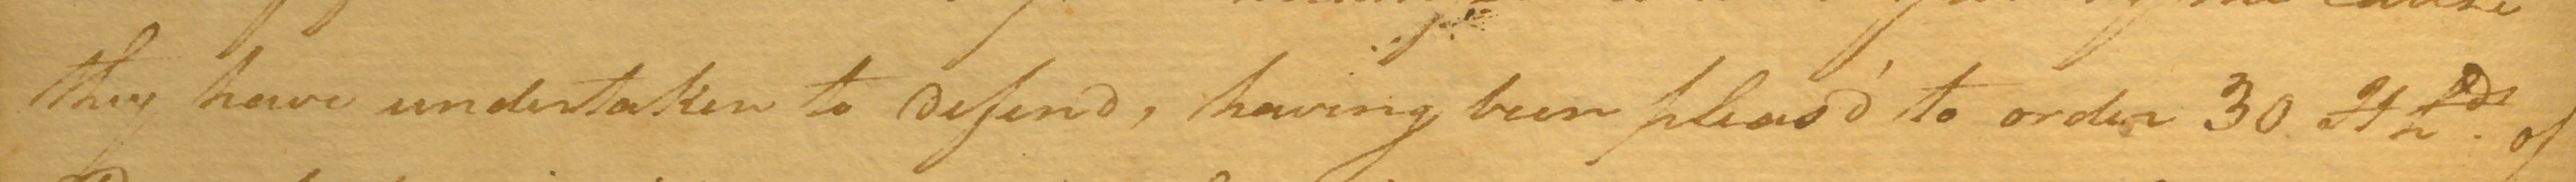they have undertaken to defend, having been pleas'd to order 30 Hh^ds. of
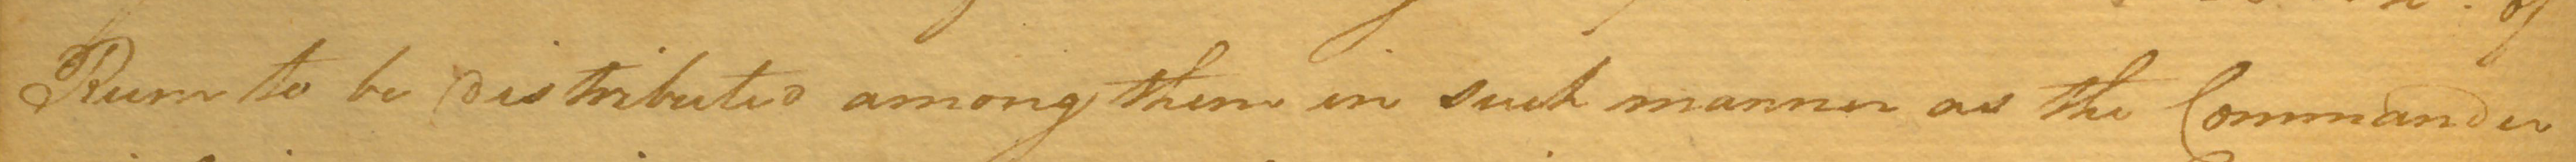Rum to be distributed among them in such manner as the Commander
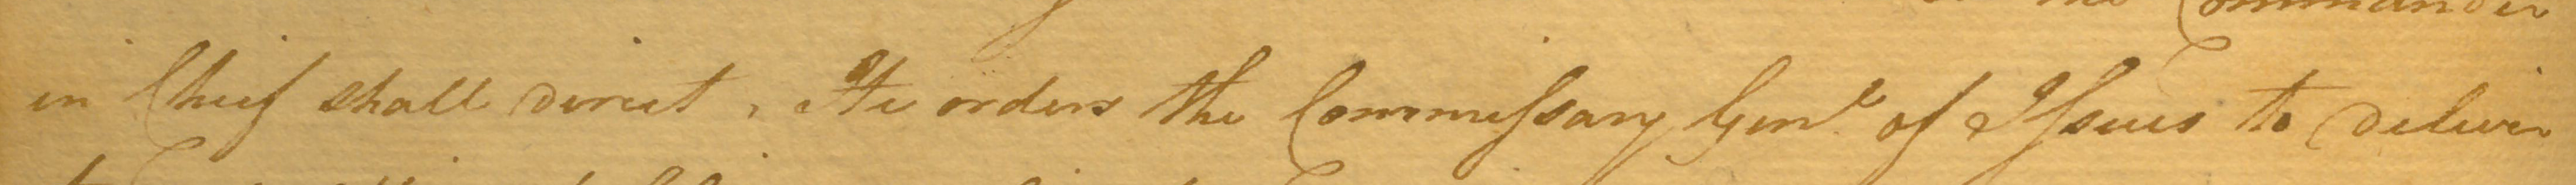in Chief shall direct. He orders the Commissary Gen^l. of Issues to deliver
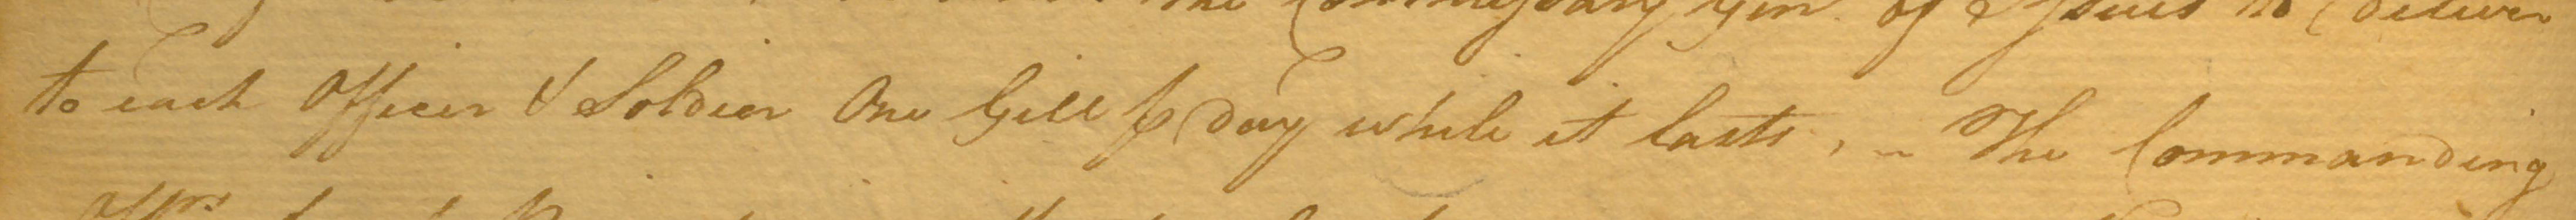to each Officer & Soldier one Gill per day while it lasts.- The Commanding
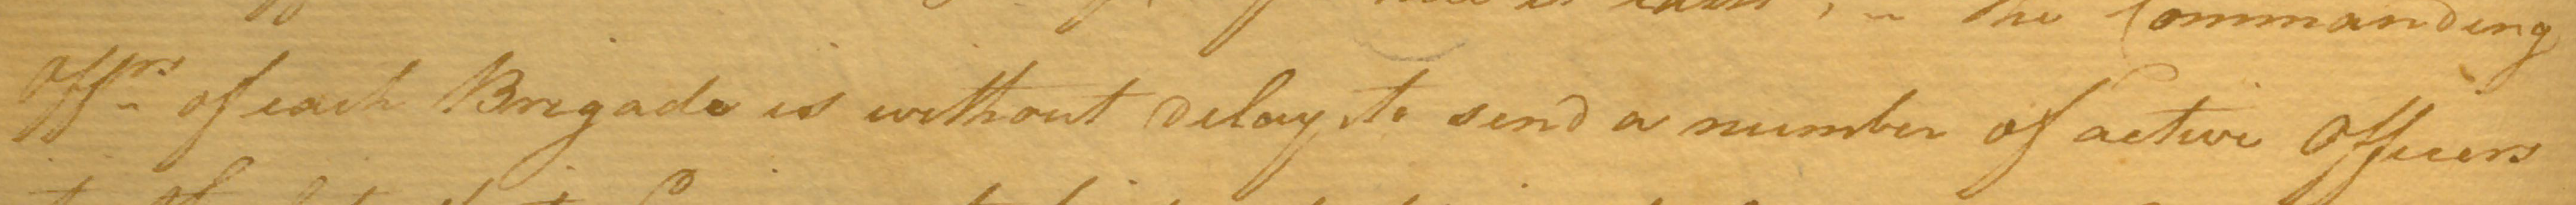Off^rs of each Brigade is without delay to send a number of active Officers
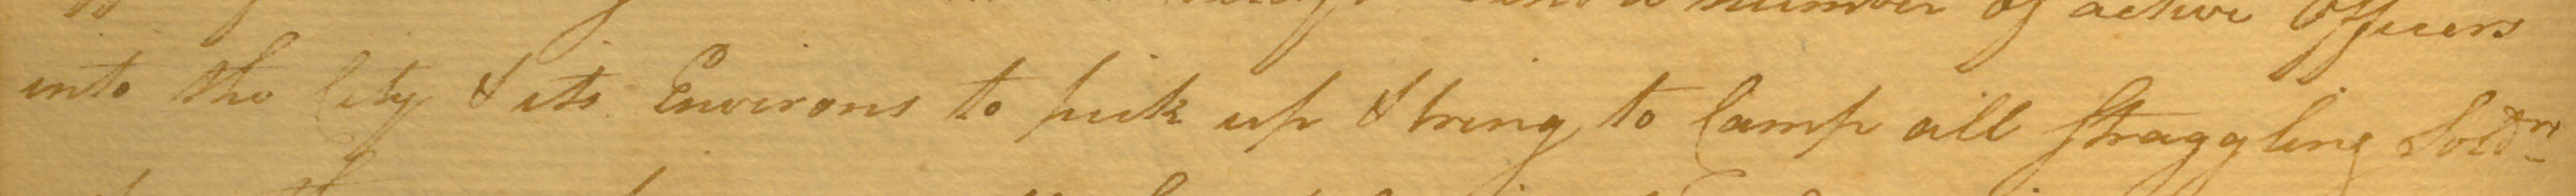into the City & its Environs to pick up & bring to Camp all Straggling Sold^rs
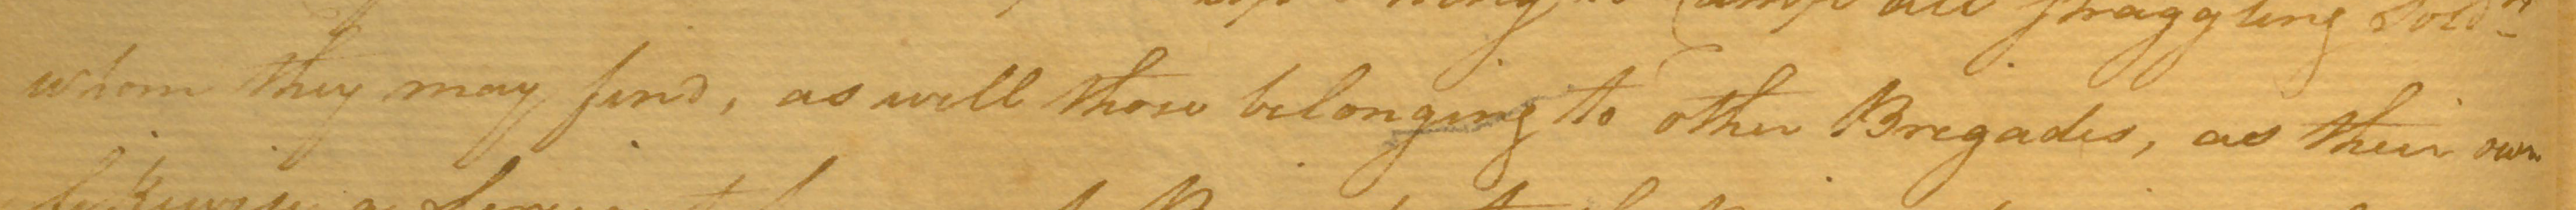whom they may find, as well those belonging to other Brigades, as their own
